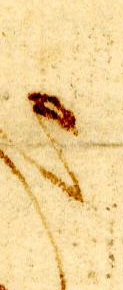To
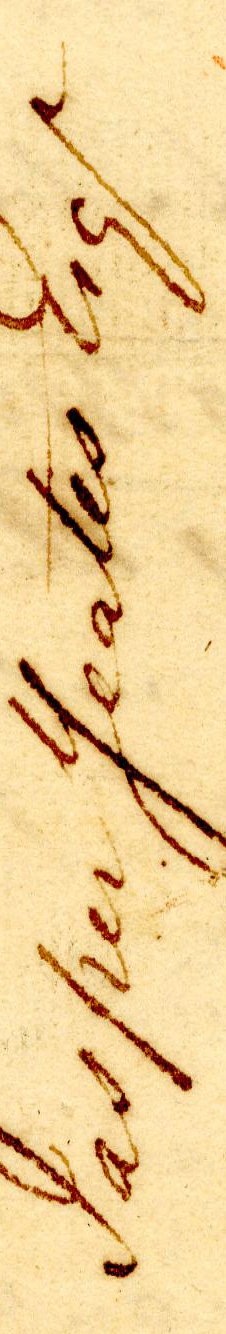Jasper Yeates Esq^r
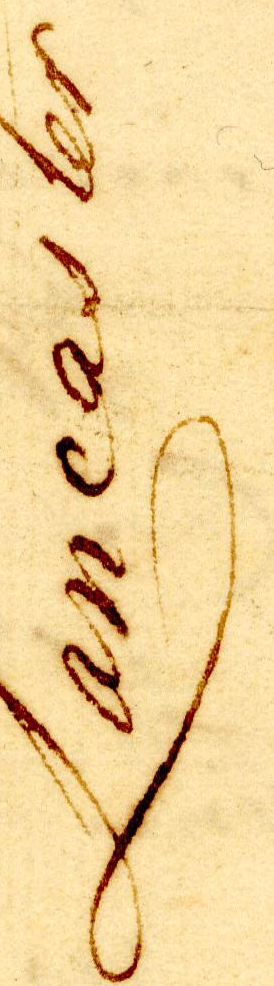Lancaster
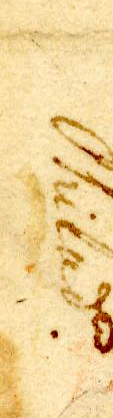Philad^a
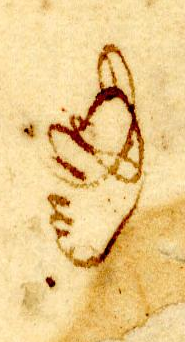Ew^d.
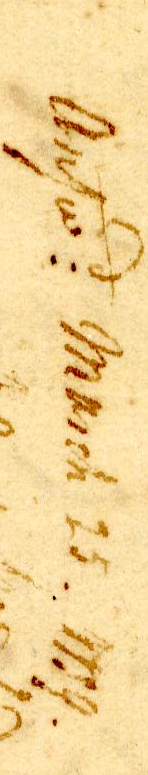Answ^d: March 25. 1779.
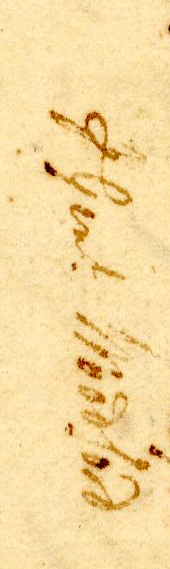Per Gen^l. Woodford
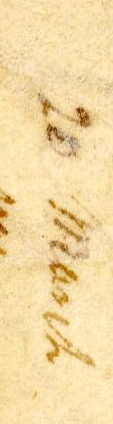20 March
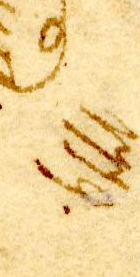1779.
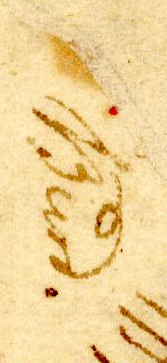Burd.
